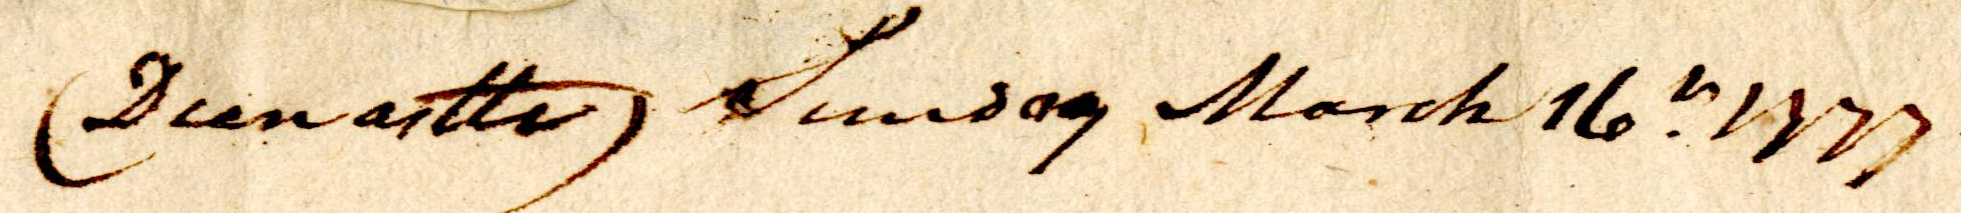(Dunatter) Sunday March 16^h. 1777
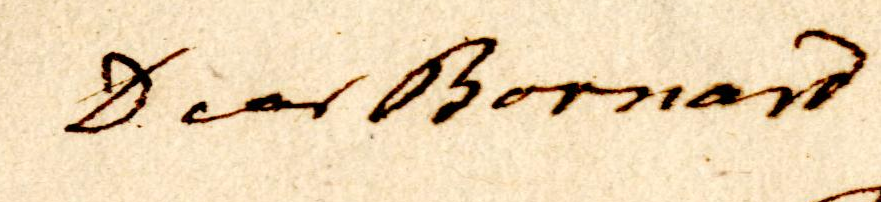Dear Barnard
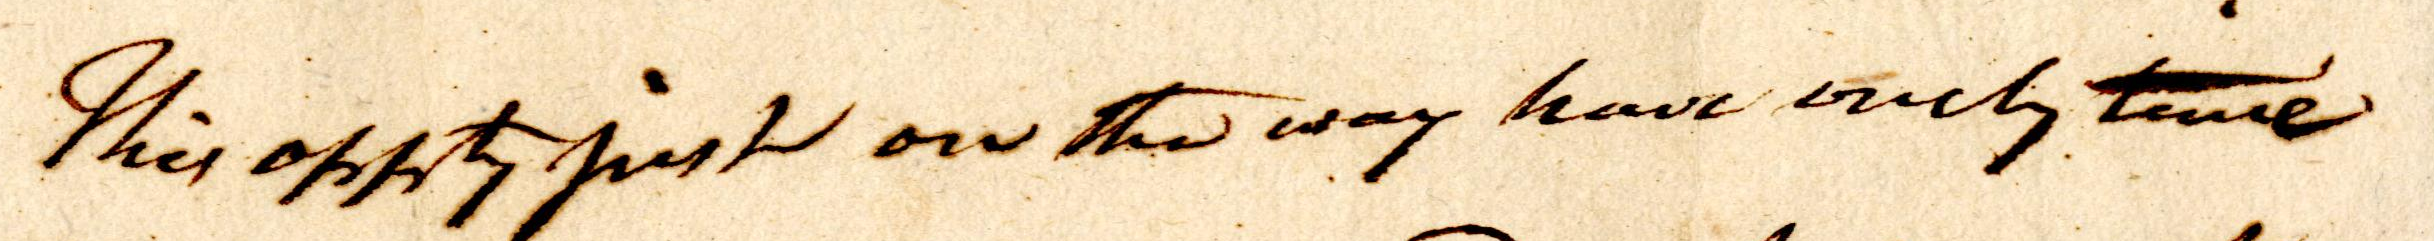This opp^y just on the way have only time
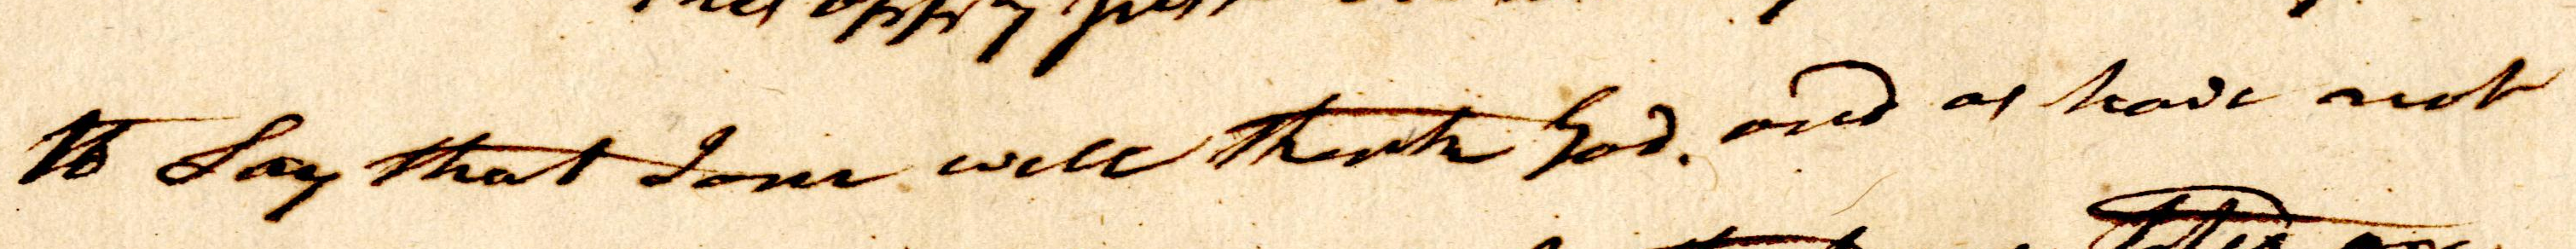to Say that I am well thank God, and as have not
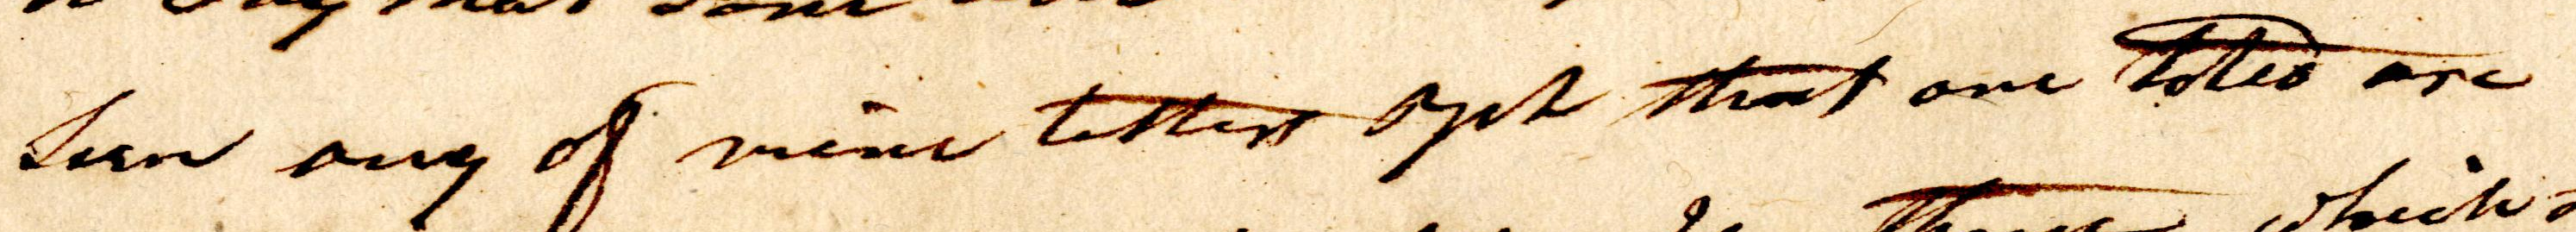seen any of mineletter yet that one told are
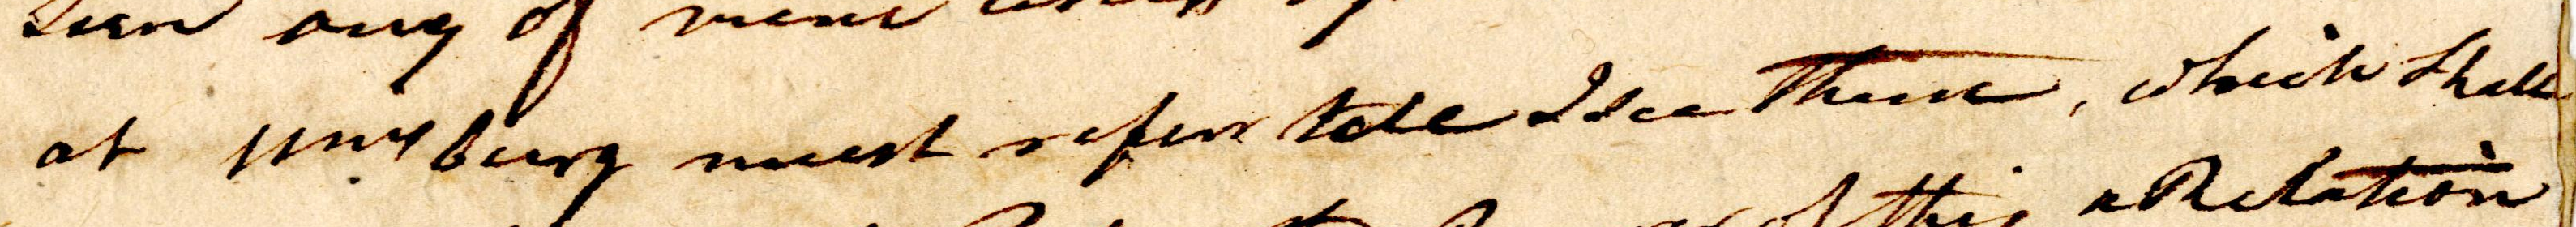at W^ms.burg must refer tell I see there, which shall
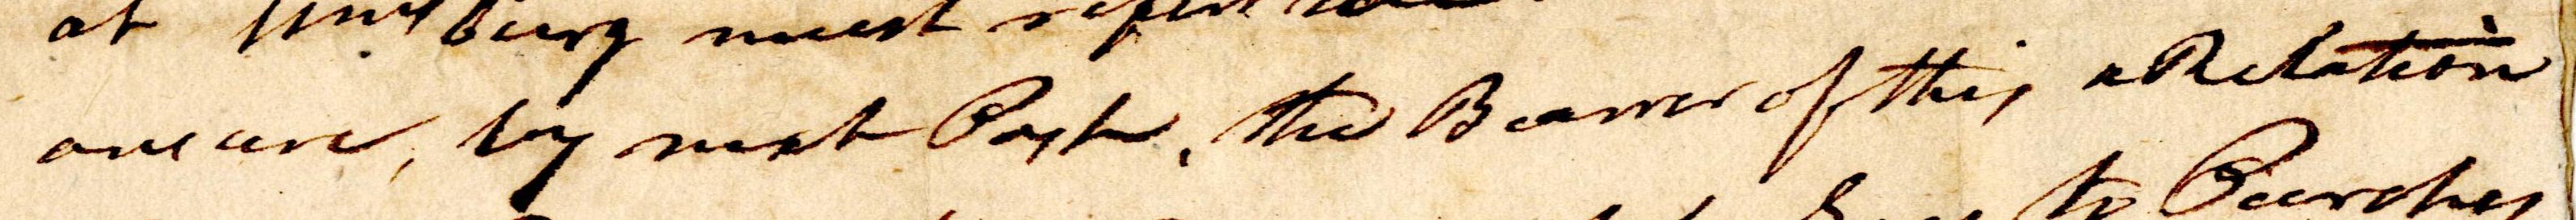answer, by next Post, the Bearer of this a Relation
